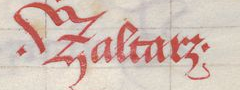.Žaltarz.
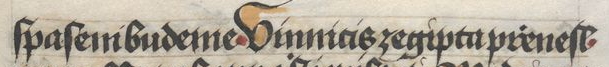ſpaſeni budeme.Vinnicis zegipta pṙeneſl.
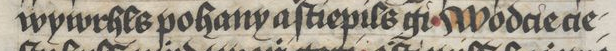wywrhls pohany a ẛtiepils gi.Wodcie cie¬
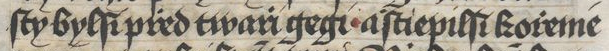ſty bylſi pṙed twaṙi gegi.a ẛtiepilſl koṙeníe
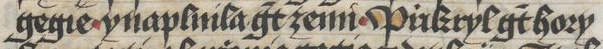gegie.y naplnila ḡt zemi.Pṙikryl ḡt hory
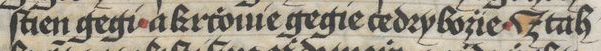ſtien gegí.akrčouie gegie cedrybożie.Ztah¬
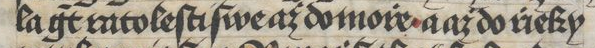la ḡt ratoleſti ſwe aż do moṙe.a aż do ṙieky
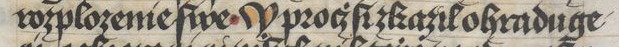rozplozenie ſwe.Y procżſi zkazil ohradu ge¬
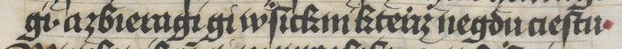gi.a zbieragi gi wẛickni kteṙiż negdu cieſtu.
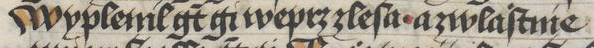Wyplenil ḡt gi weprz zleſa.a zwlaẛtnie
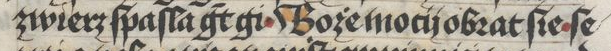zwierz ſpaſla ḡt gi.Boże mocij obrat ſie.ſe
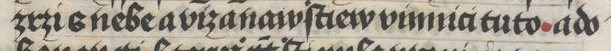zrzi s nebe a viz a nawẛtiew vinnici tuto.a do¬
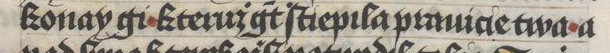konay gi.kteruż ḡt ẛtiepila prauicie twa.a
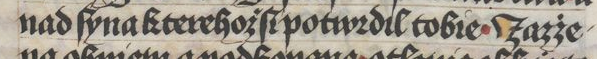nad ſyna kterehož ſi potwrzdil tobie.Zazże
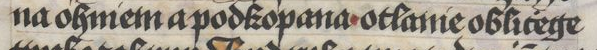na ohniem a podkopana.otlanie obliċege
